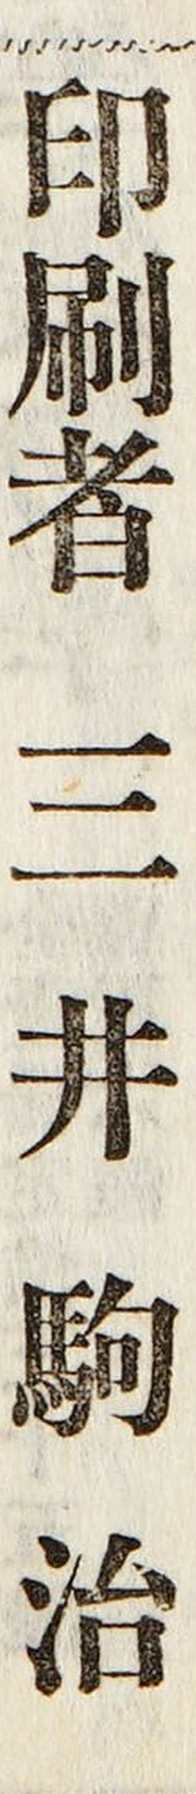印刷者三井駒治
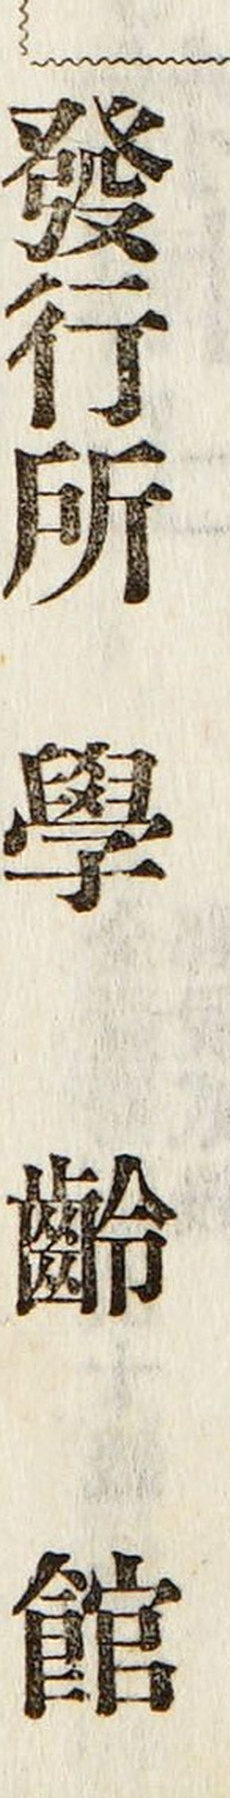発行所学齢館
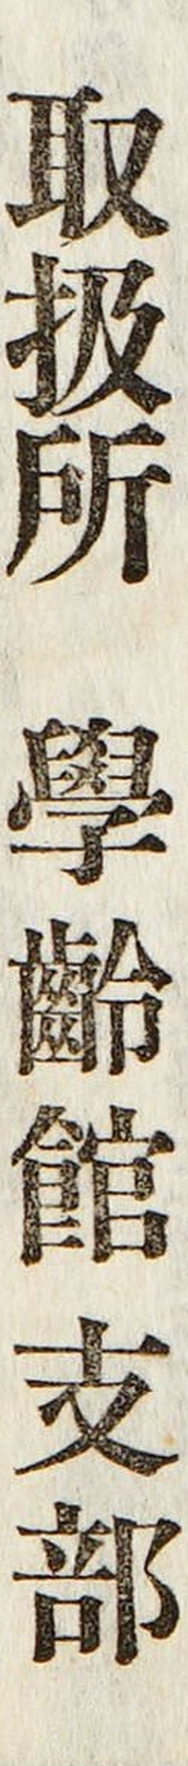取扱所学齢館支部
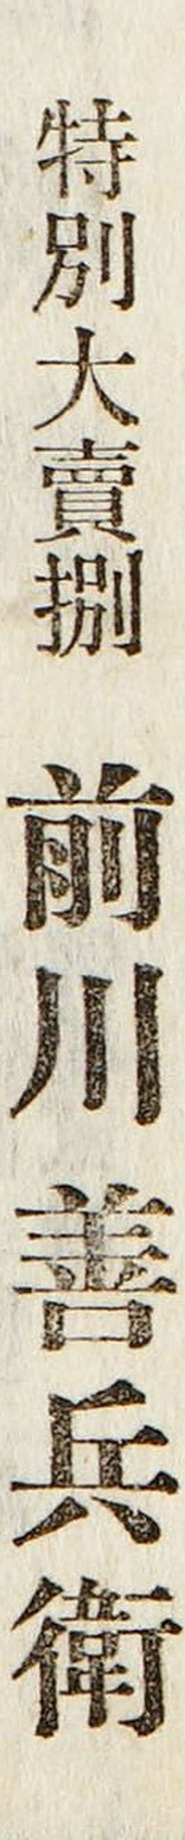特別大売捌前川善兵衛
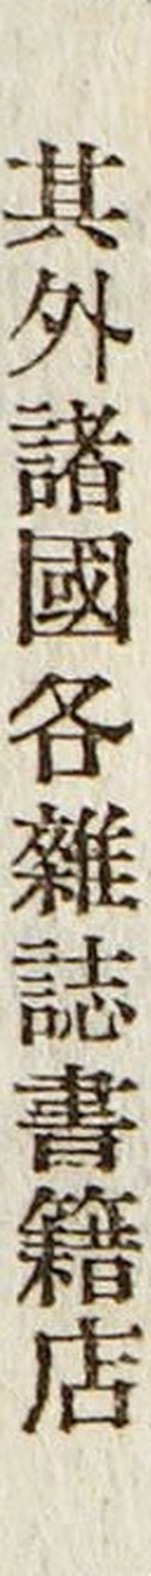其外諸国各雑誌書籍店

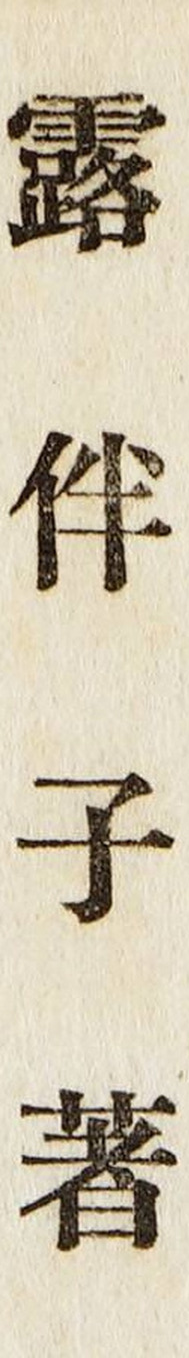露伴子著
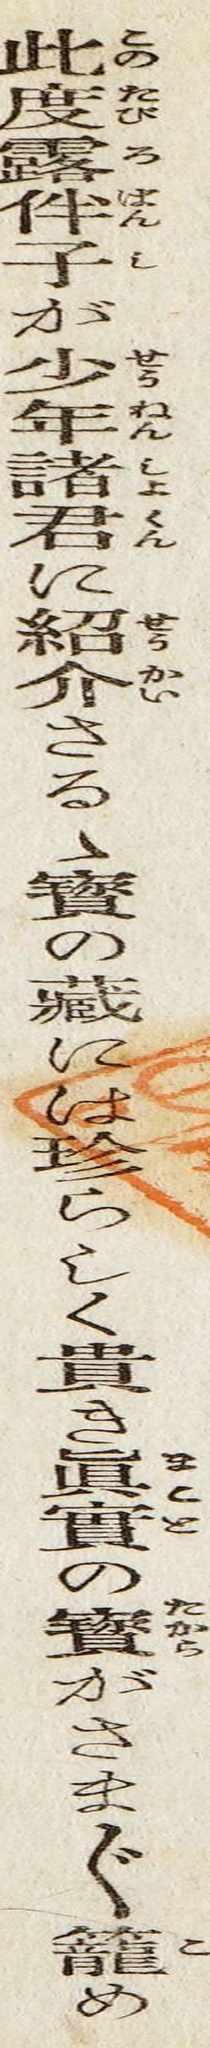此度露伴子が少年諸君に紹介さるゝ宝の蔵には珍らしく貴き真実の宝がさま〴〵籠め
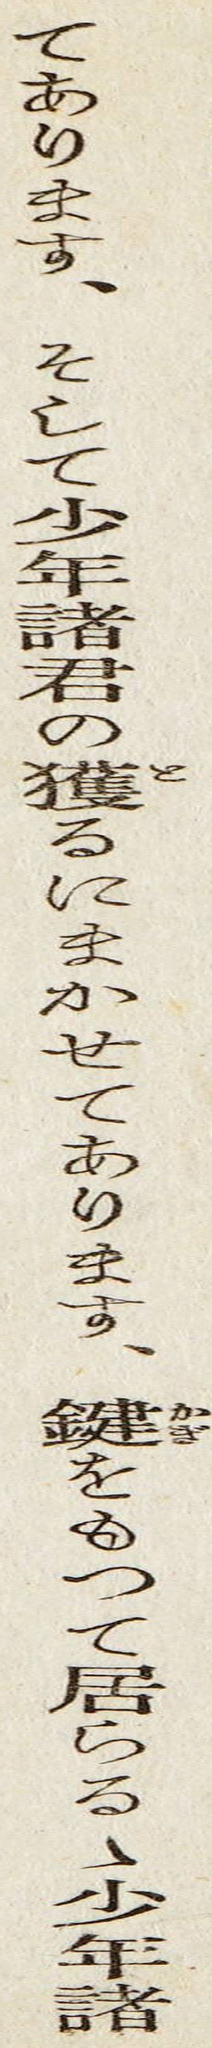てあります、そして少年諸君の獲るにまかせてあります、鍵をもつて居らるゝ少年諸
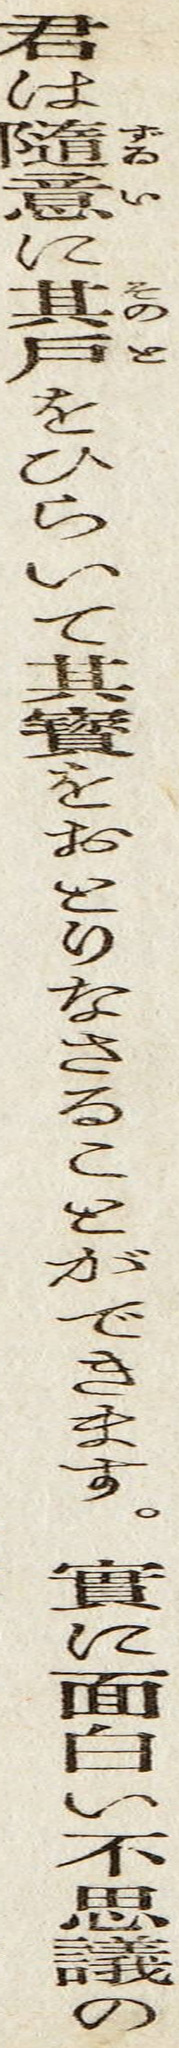君は随意に其戸をひらいて其宝をおとりなさることができます。実に面白い不思議の
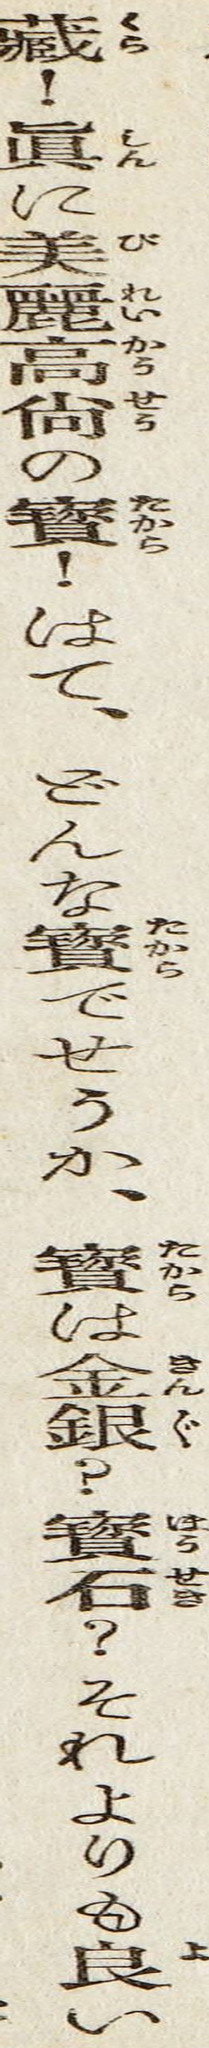蔵！真に美麗高尚の宝！はて、どんな宝でせうか、宝は金銀？宝石？それよりも良い
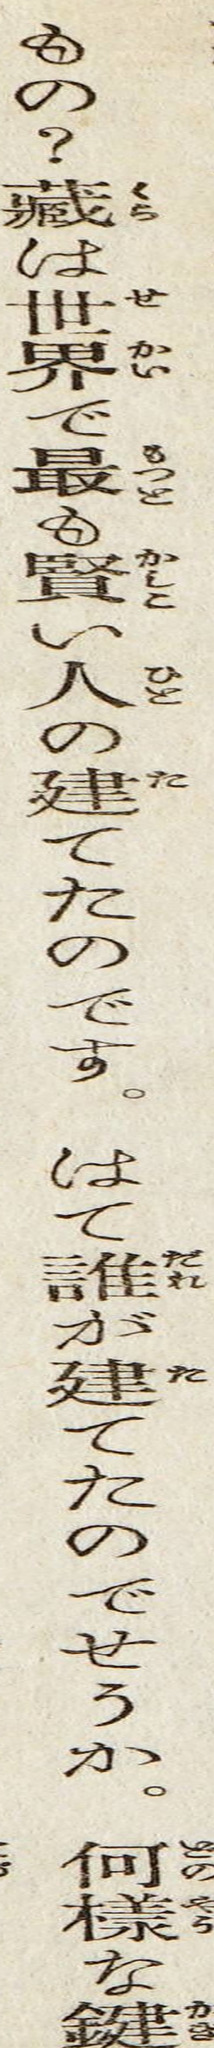もの？蔵は世界で最も賢い人の建てたのです。はて誰が建てたのでせうか。何様な鍵
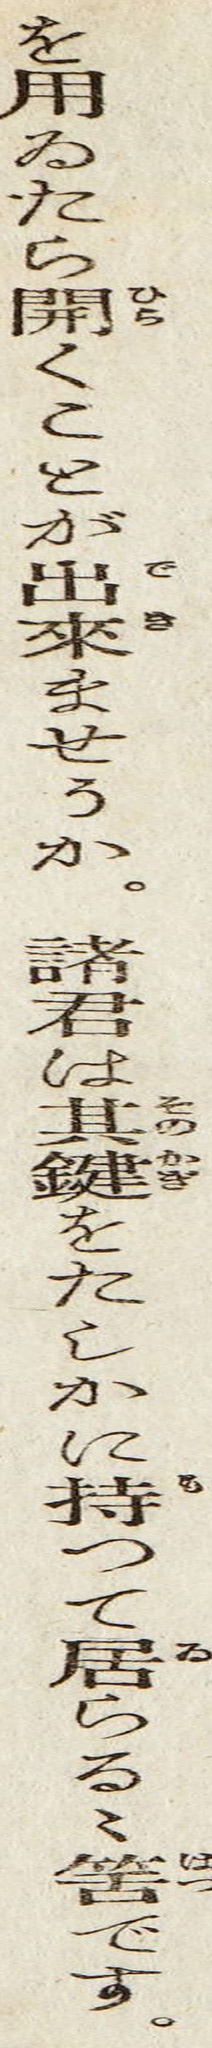を用ゐたら開くことが出来ませうか。諸君は其鍵をたしかに持つて居らる〻筈です。
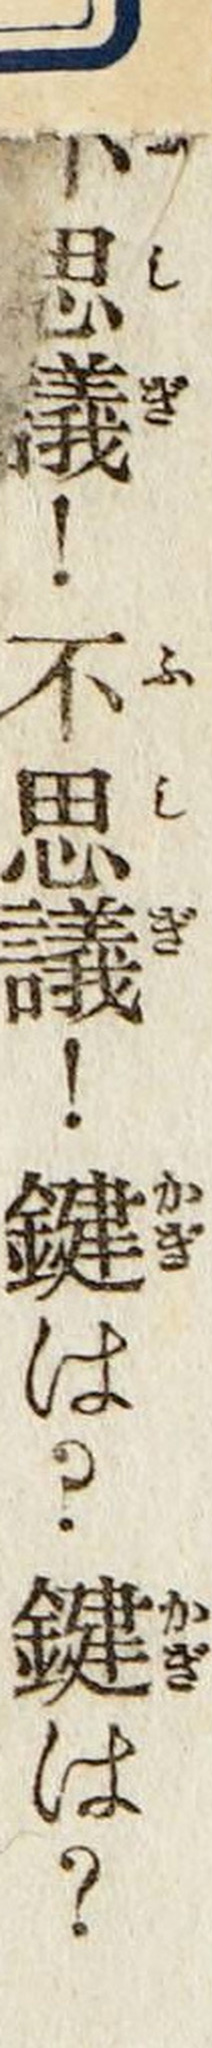不思議！不思議！鍵は？鍵は？
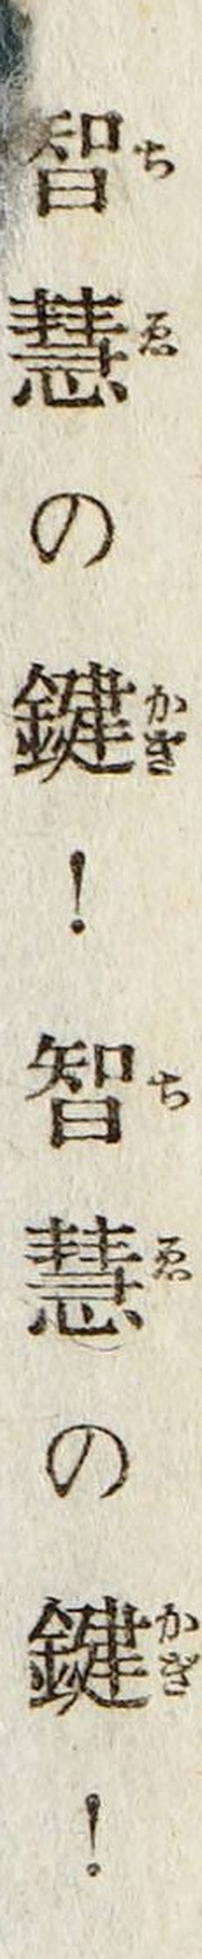智慧の鍵！智慧の鍵！

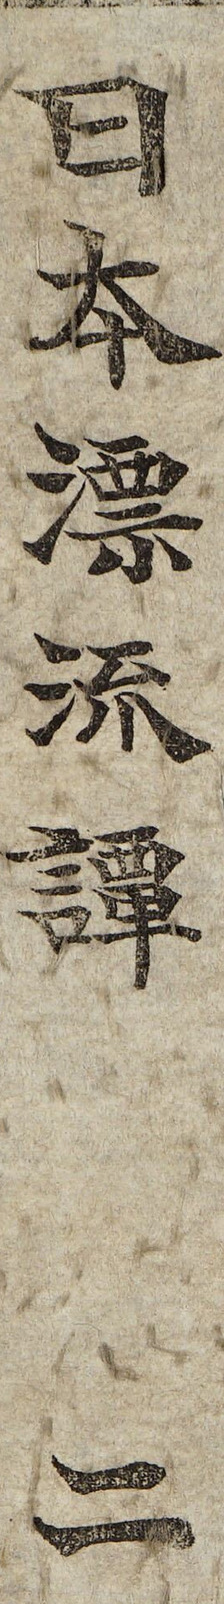日本漂流譚二

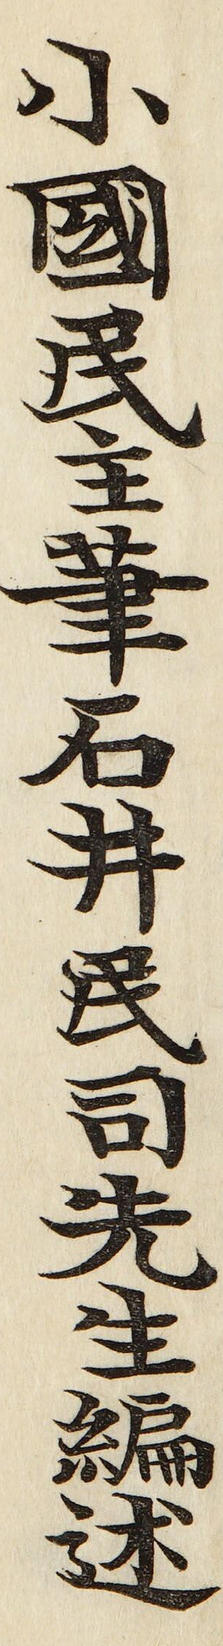小国民主茟石井民司先生編述
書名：日本漂流譚
